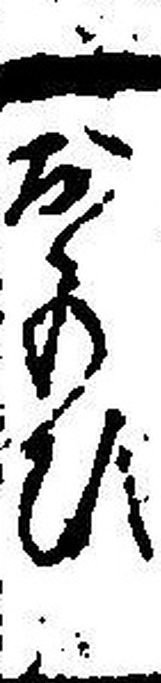おもひ
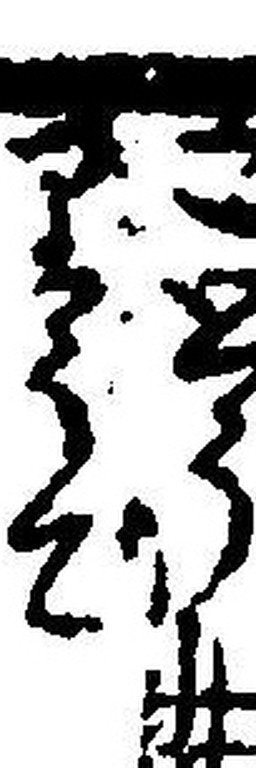りうで
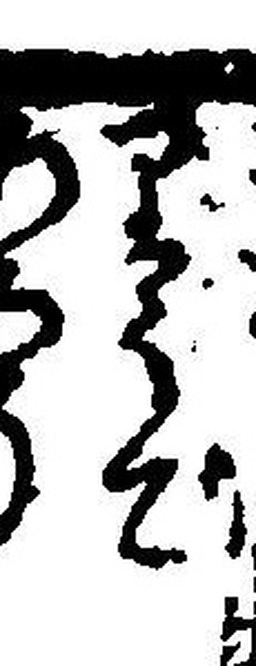あろう
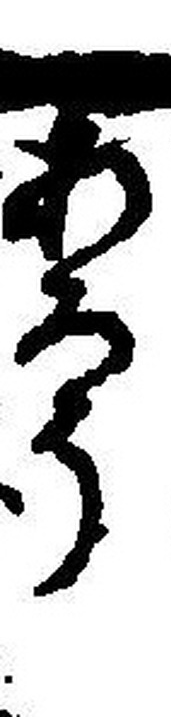あろう
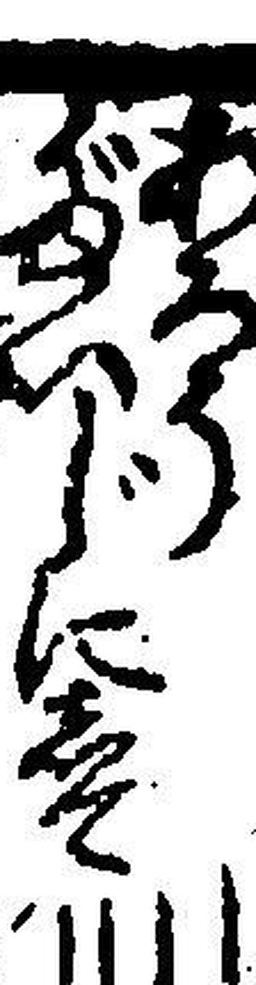だいじにして
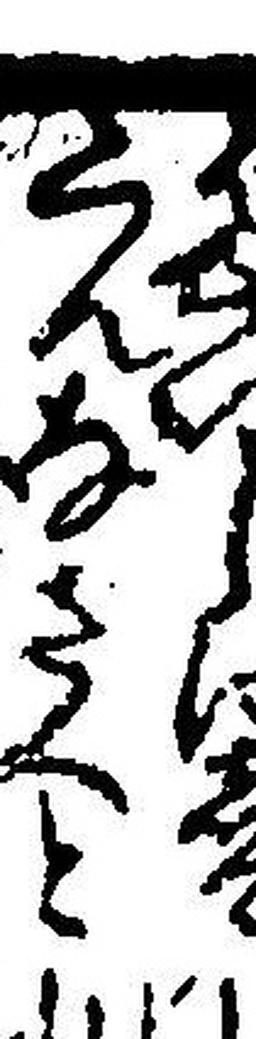くんなさへと
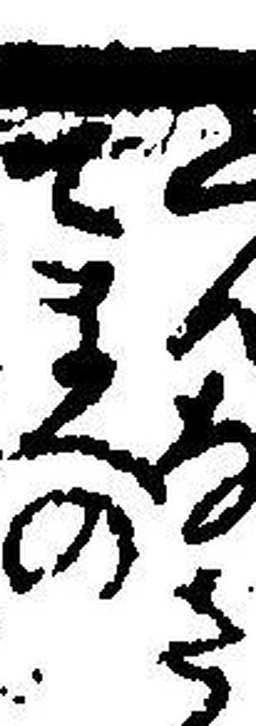てまへの
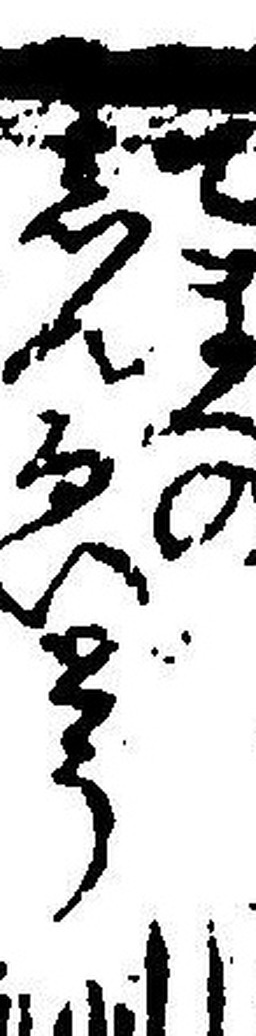しんるいとう
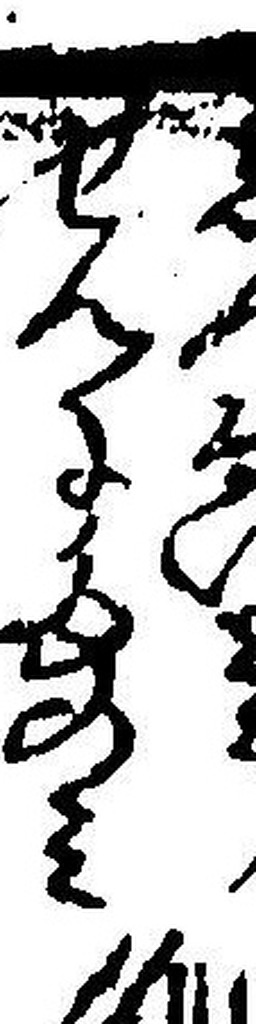せんにたのみ
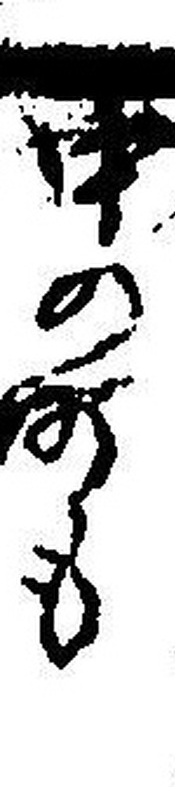中の町も
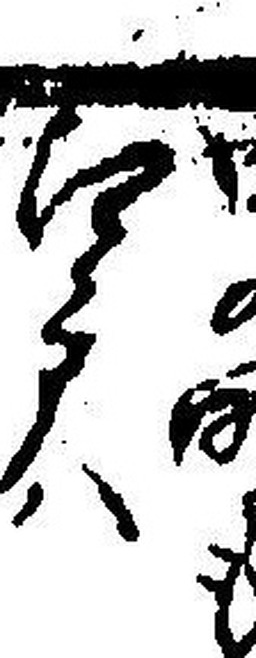江戸は
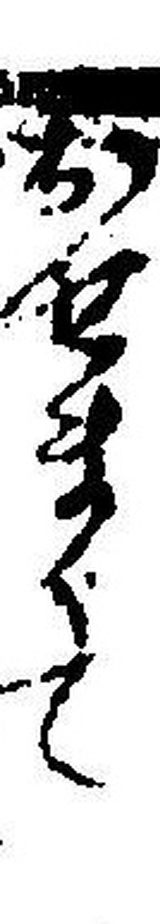おせまくて
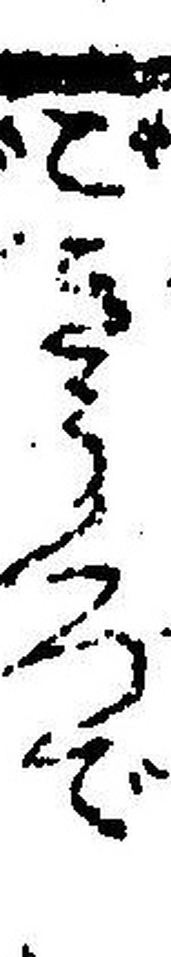ごきうくつで
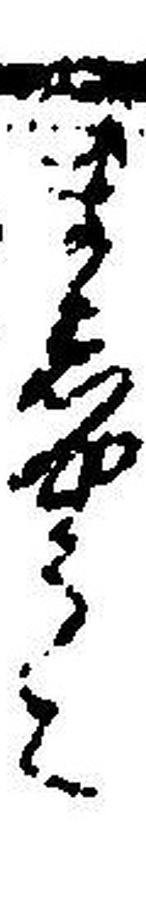ましやうと
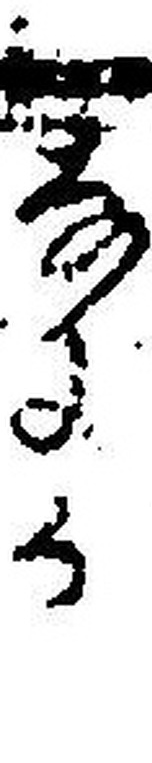なにか
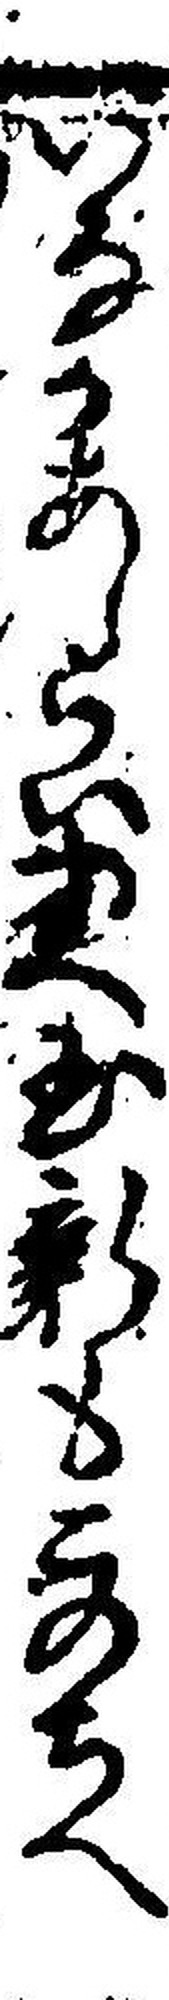いなかあしらいゆへ玉新もこのちへ
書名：間違狐之女郎買 / 市場通笑作
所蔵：東京大学総合図書館 General Library in the University of Tokyo, JAPAN
